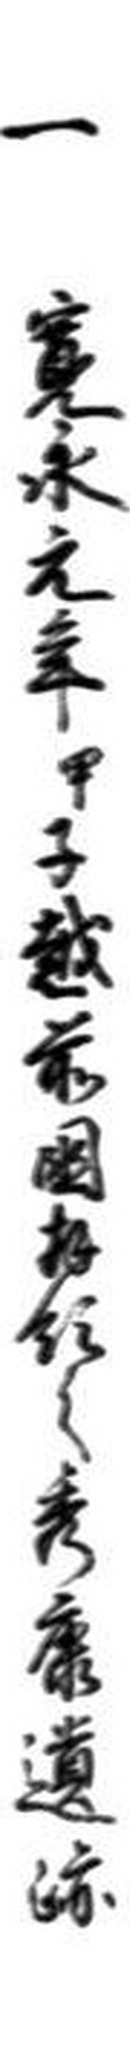一寛永元年甲子越前国拝領之秀康遺跡
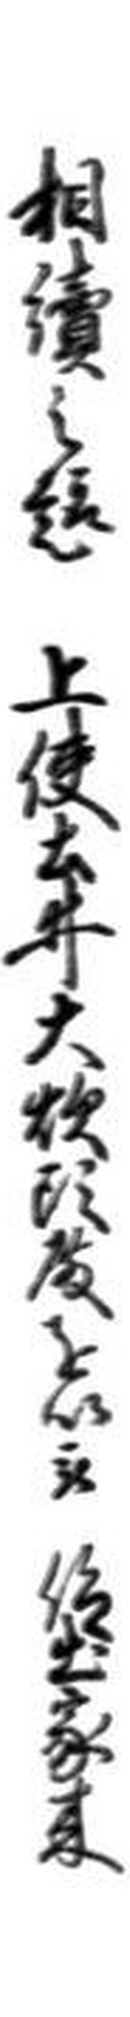相続之趣上使土井大炊頭殿を以被仰出家来

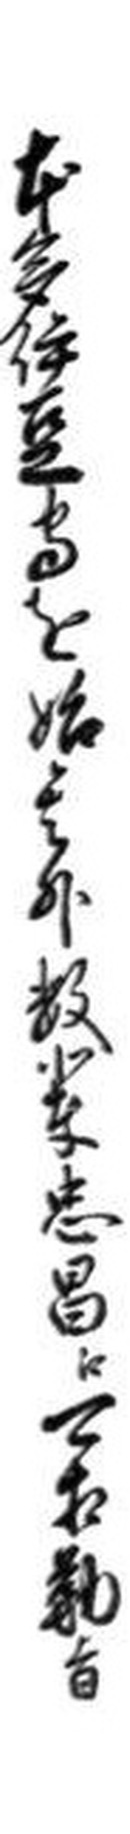本多伊豆守を始其外数輩忠昌江可相勤旨
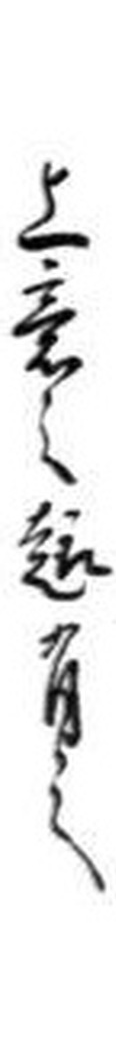上意之趣有之
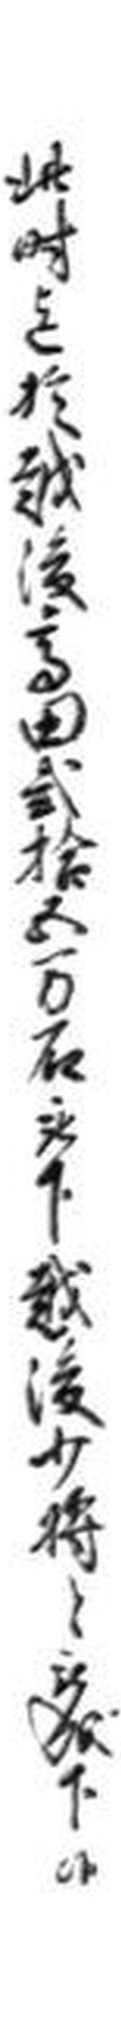此時迄於越後高田弐拾五万石被下越後少将と披成下候
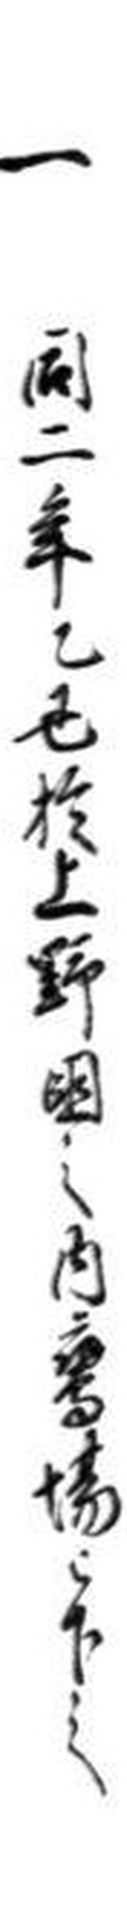一同二年乙乙丑於上野国之内鷹場被下之
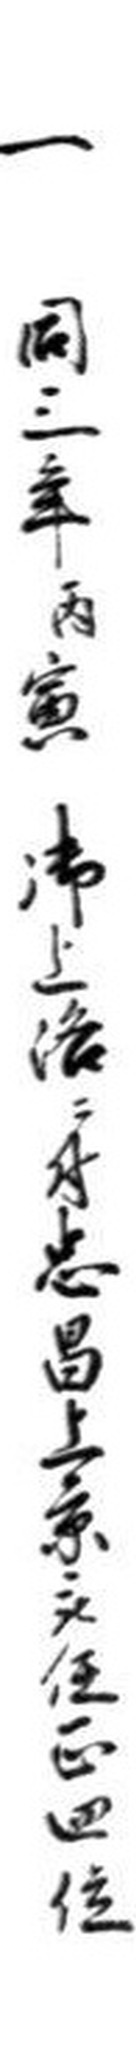一同三年丙寅御上洛ニ付忠昌上京被任正四位
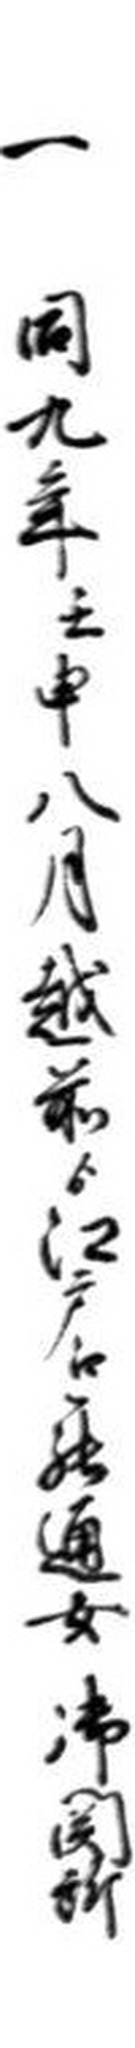一同九年壬申八月越前ゟ江戸江罷通女御関所
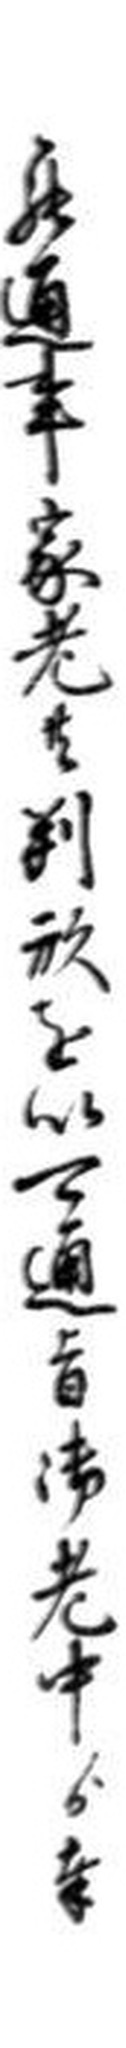罷通事家老共判形を以可通旨御老中ゟ奉
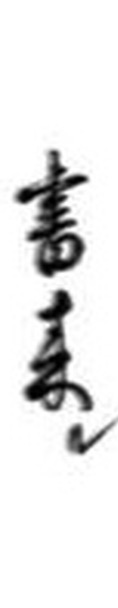書来ル
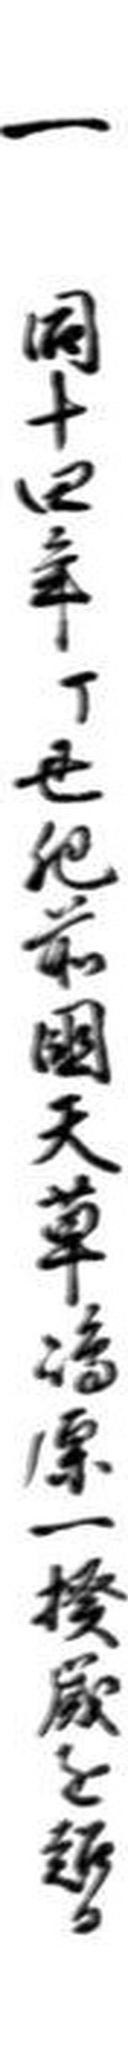一同十四年丁丑肥前国天草嶋原一揆歳を超而
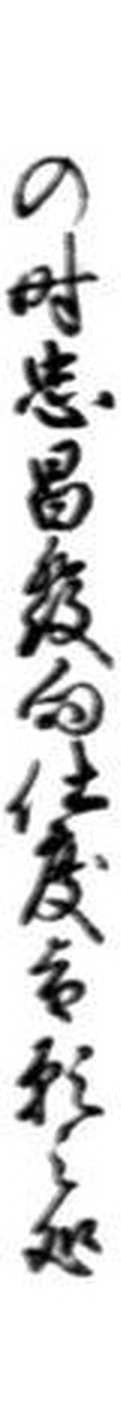の時忠昌発向仕度旨願之処
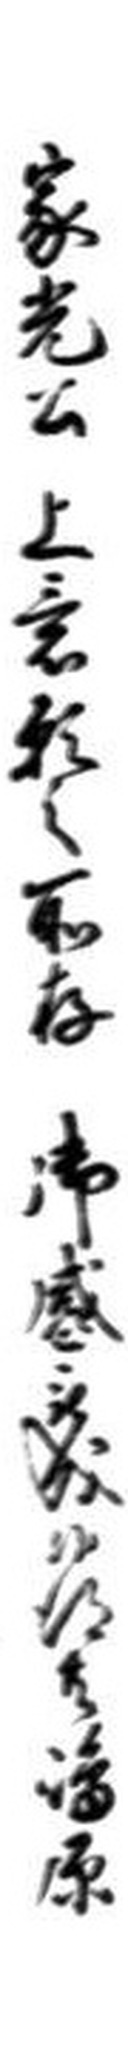家光公上意願之所存御感被成候得共嶋原
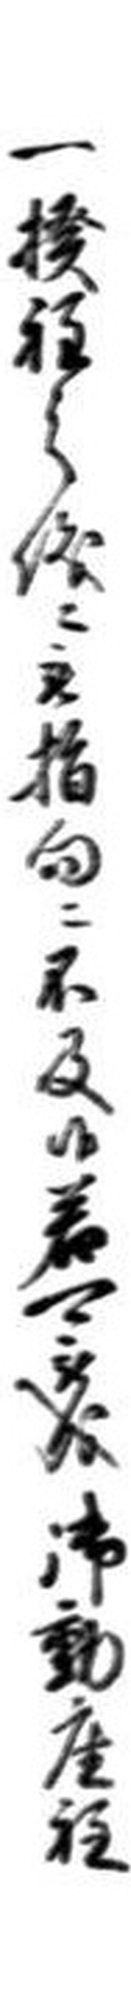一揆程之儀ニ被指向ニ不及候若可被成御動座程
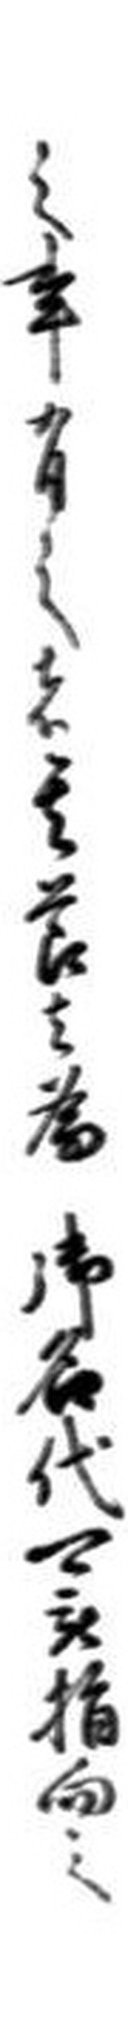之事有之者其節者為御名代可被指向之
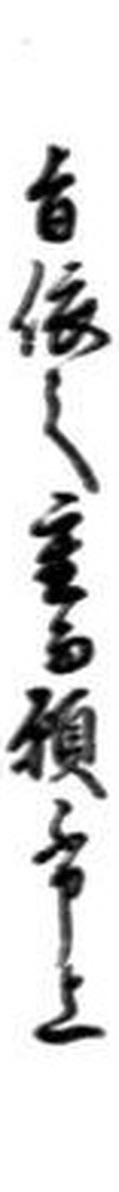旨依之重而願不申上
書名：家譜 三十一 吉邦公 享保元年
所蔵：福井県文書館 Fukui Prefectural Archives
